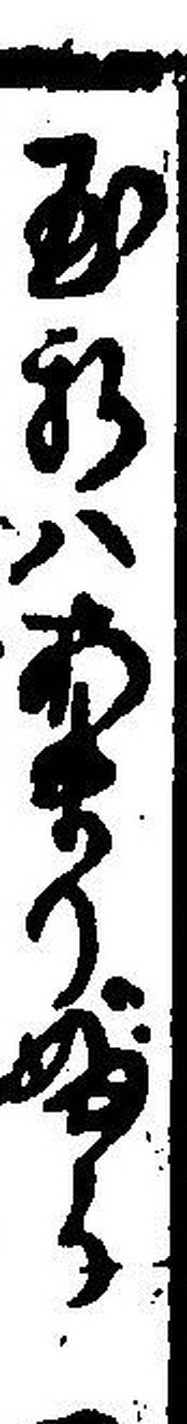玉新はあまりぶら
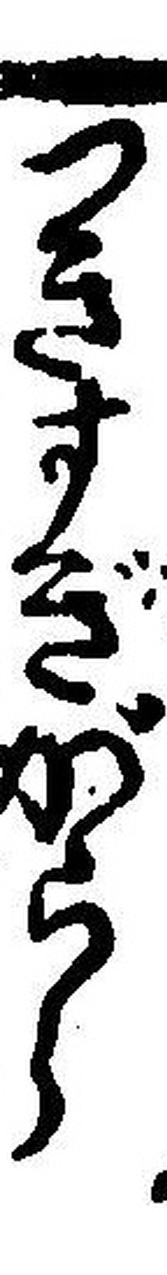つきすぎがらし？
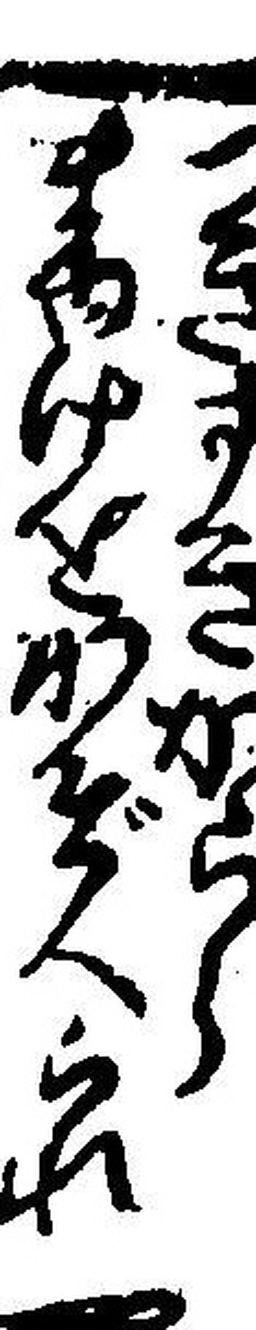まゆけをかぞへられ
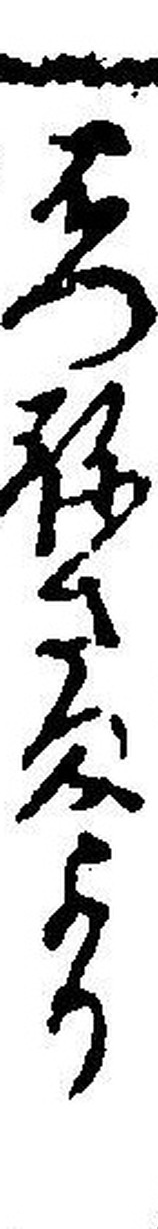はつねさまより
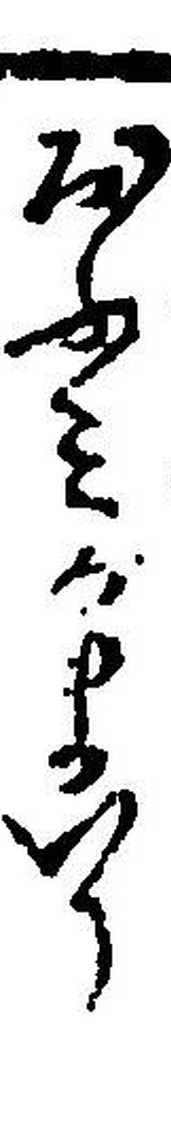おふみがまいり
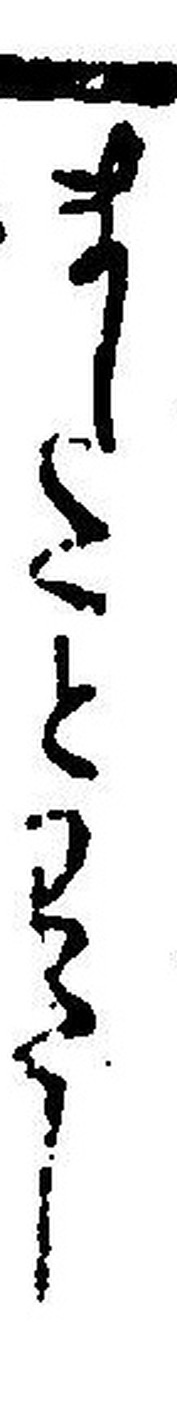ましたとわたし
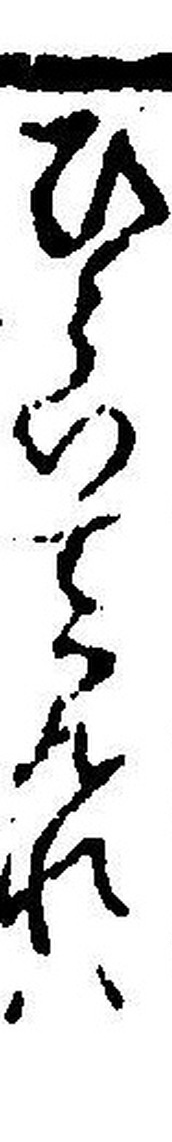ひらいて見れは
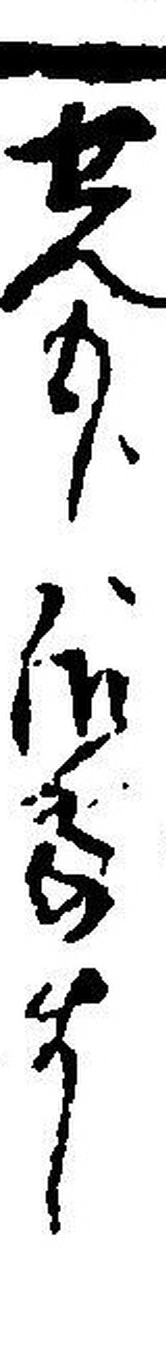せんもじは御たまし
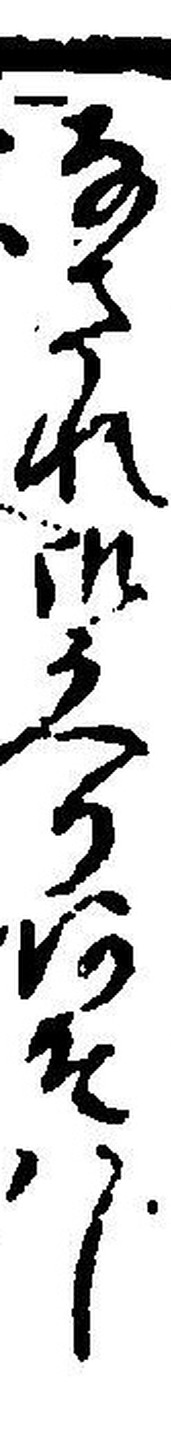なされ御かへりあそはし
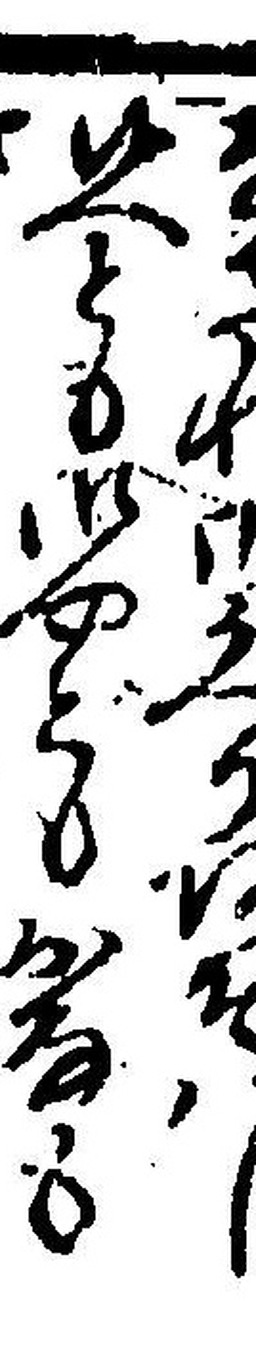給へとも御やどもおなも
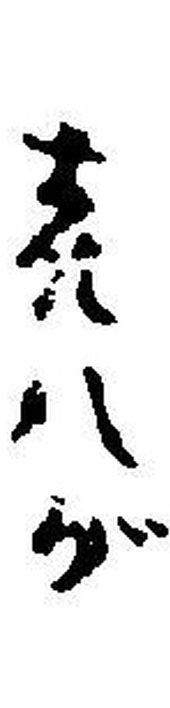喜八が
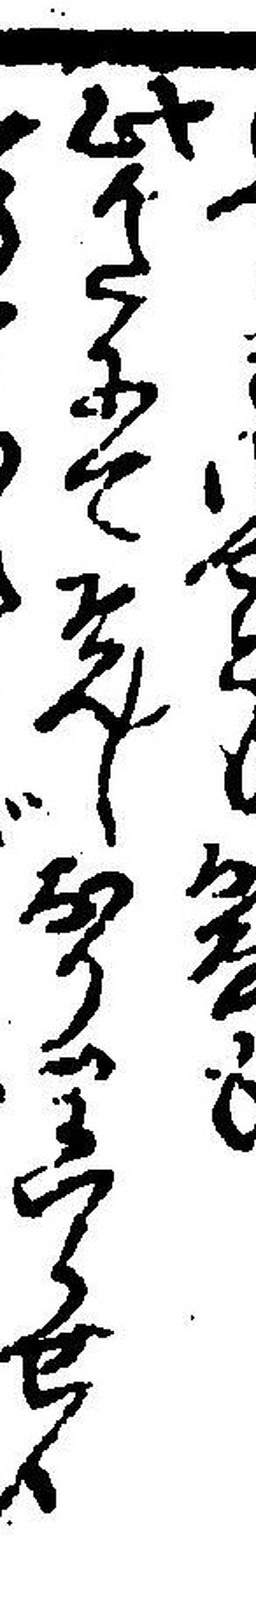此かたにてそんしおりまいらせん
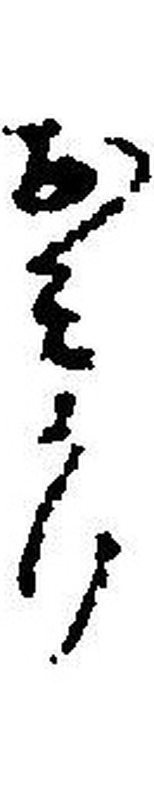おみかけ
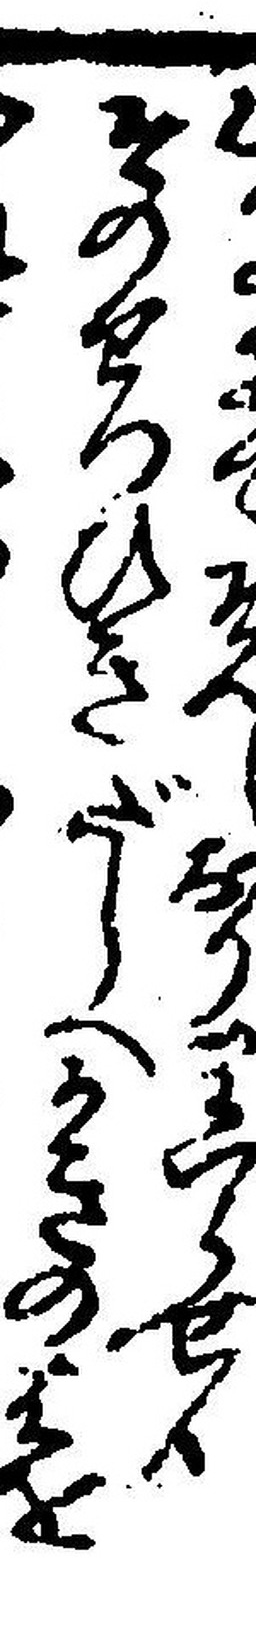そのせつひきだしへかきのはを
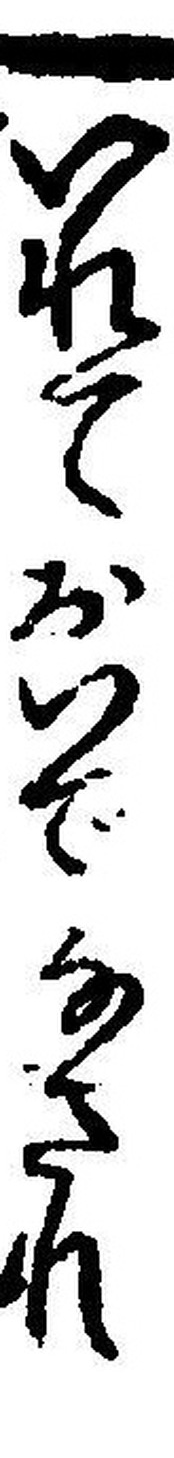いれておいでなされ
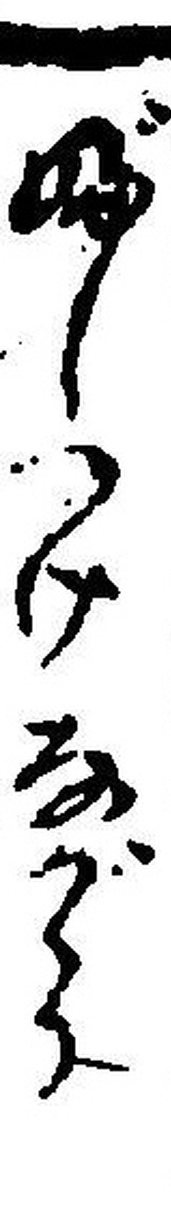ぶしつけながら
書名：間違狐之女郎買 / 市場通笑作
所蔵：東京大学総合図書館 General Library in the University of Tokyo, JAPAN
